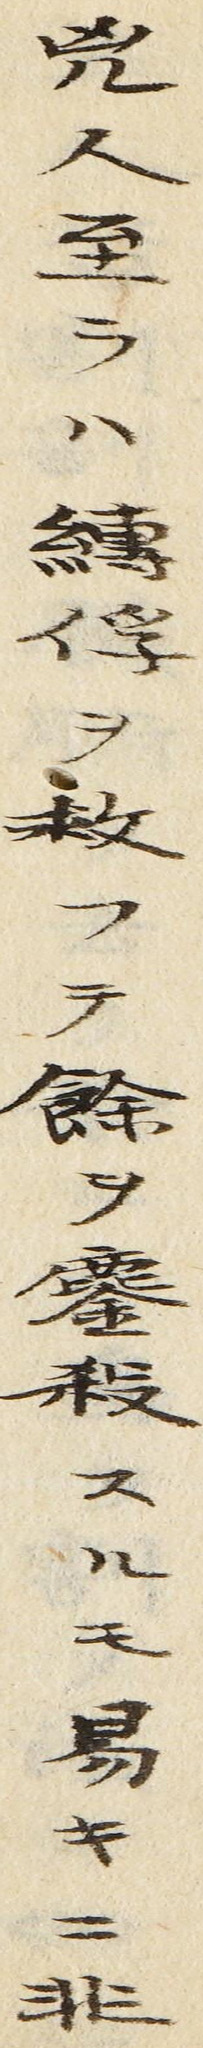兇人至ラハ縛俘ヲ救フテ余ヲ鏖殺スルモ易キニ非
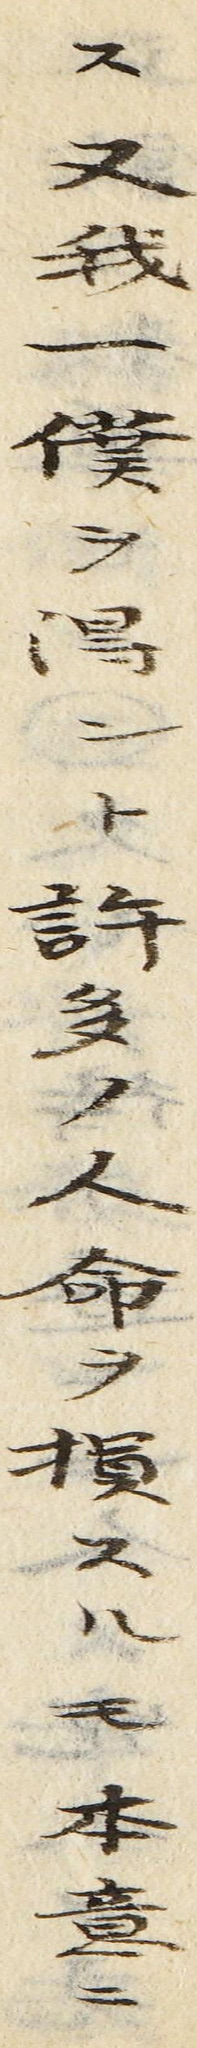ス又我一僕ヲ得ント許多ノ人命ヲ損スルモ本意ニ
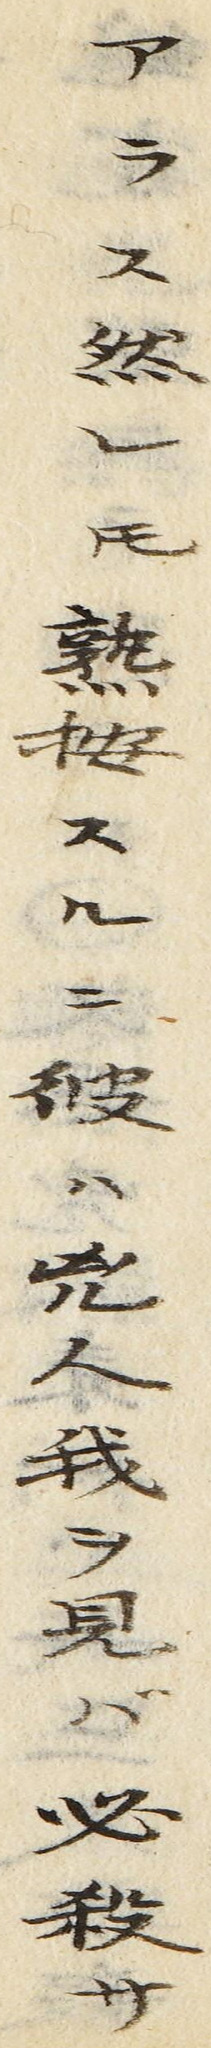アラス然レトモ熟按スルニ彼ハ兇人我ヲ見バ必殺サ
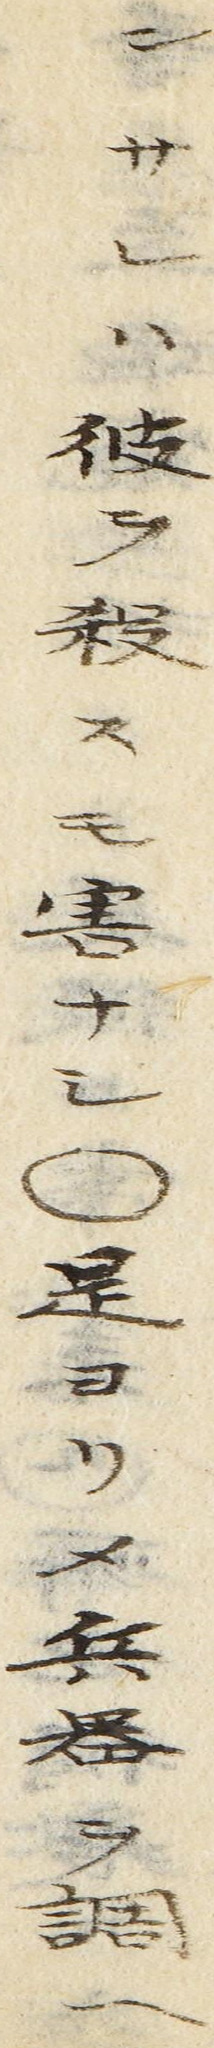ンサレハ彼ヲ殺スモ害ナシ◯是ヨリシテ兵器ヲ調ヘ
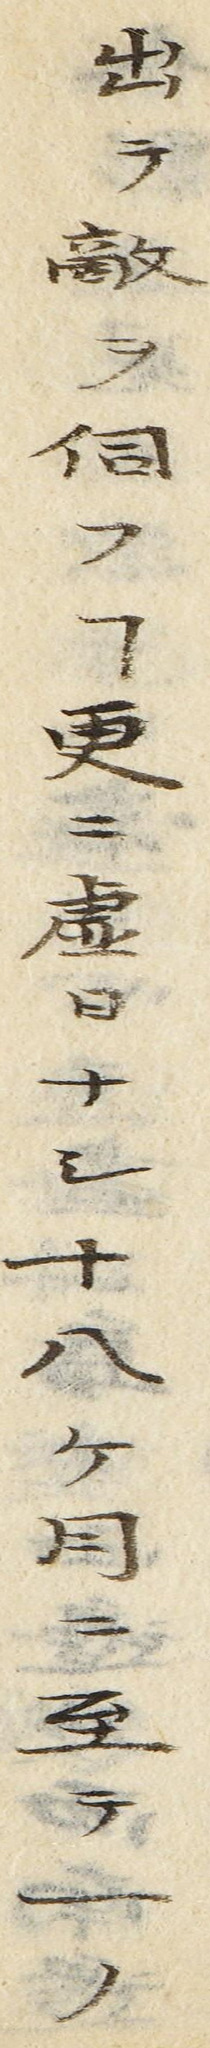出テ敵ヲ伺フコト更ニ虚日ナシ十八ケ月ニ至テ一ノ

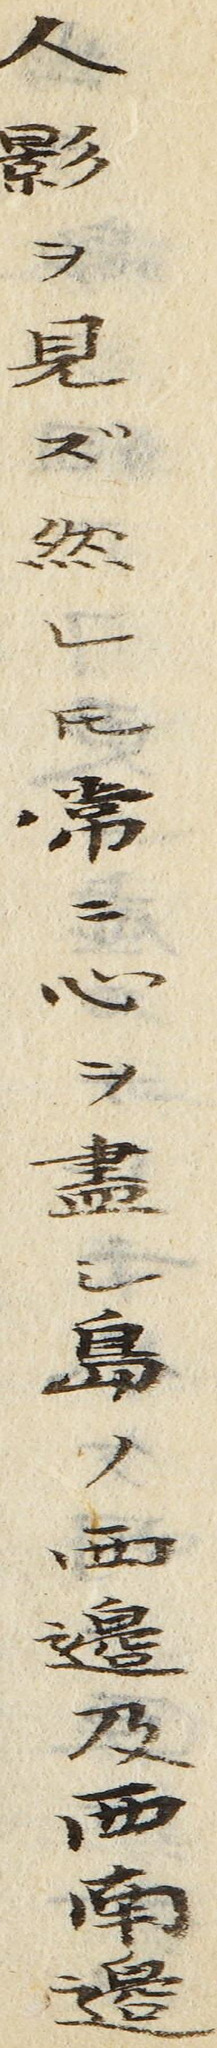人影ヲ見ズ然レトモ常ニ心ヲ尽シ島ノ西辺及西南辺
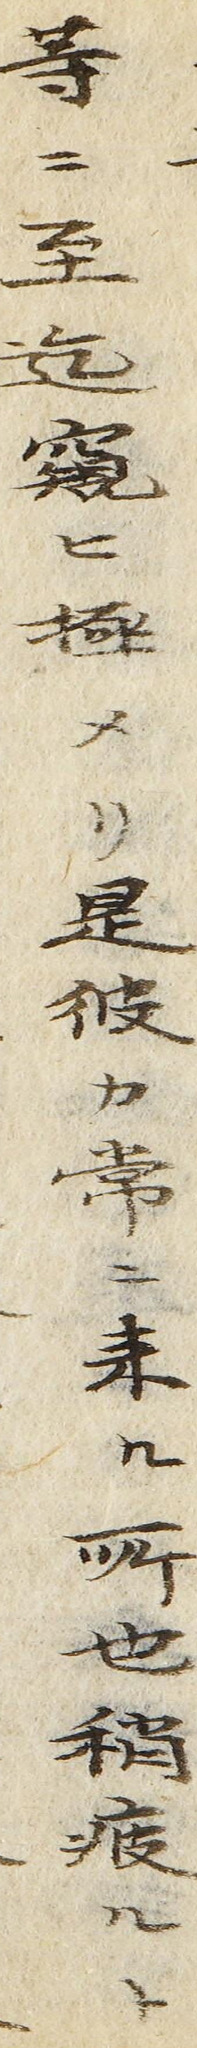等ニ至迄窺ヒ極メリ是彼カ常ニ来ル所也稍疲ルト
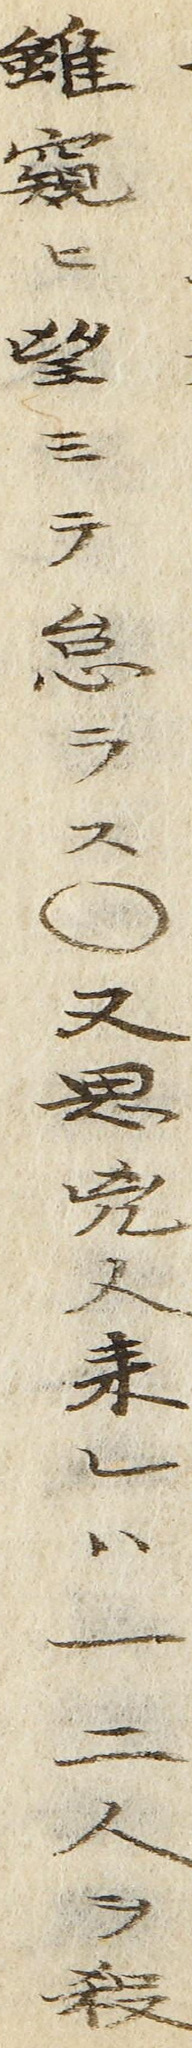雖窺ヒ望ミテ怠ラス◯又思兇人来レハ一二人ヲ殺
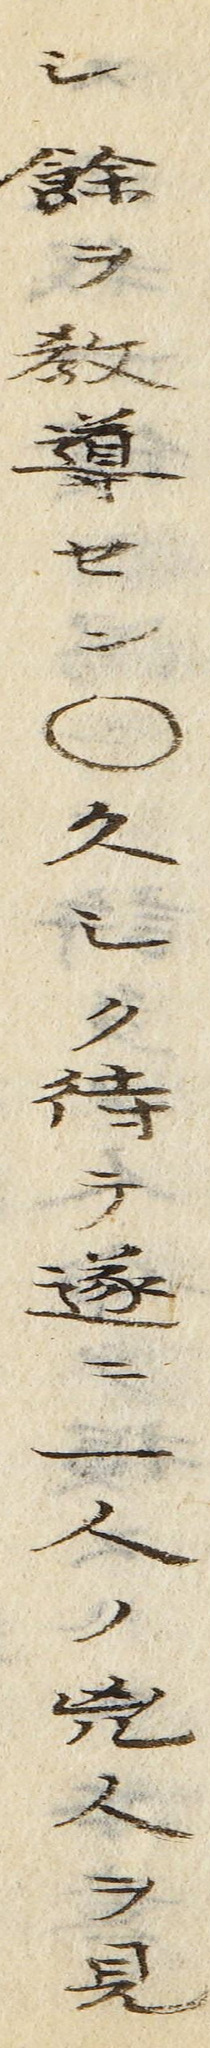シ余ヲ教導セン◯久シク待テ遂ニ一人ノ兇人ヲ見
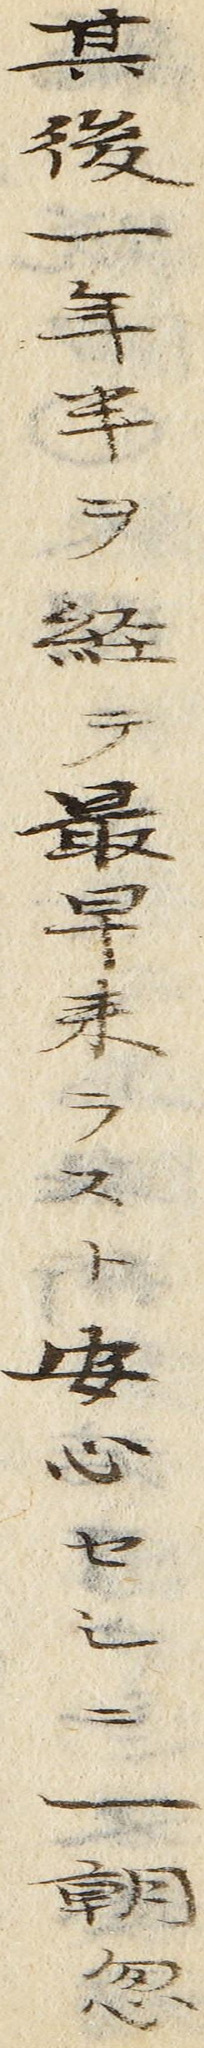其後一年半ヲ経テ最早来ラスト安心セシニ一朝忽
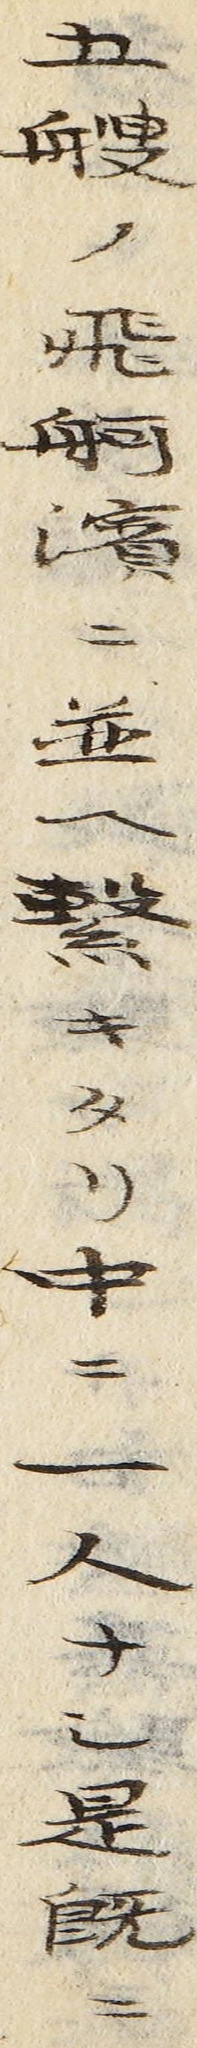五艘ノ飛舸浜ニ並ヘ繋キタリ中ニ一人ナシ是既ニ
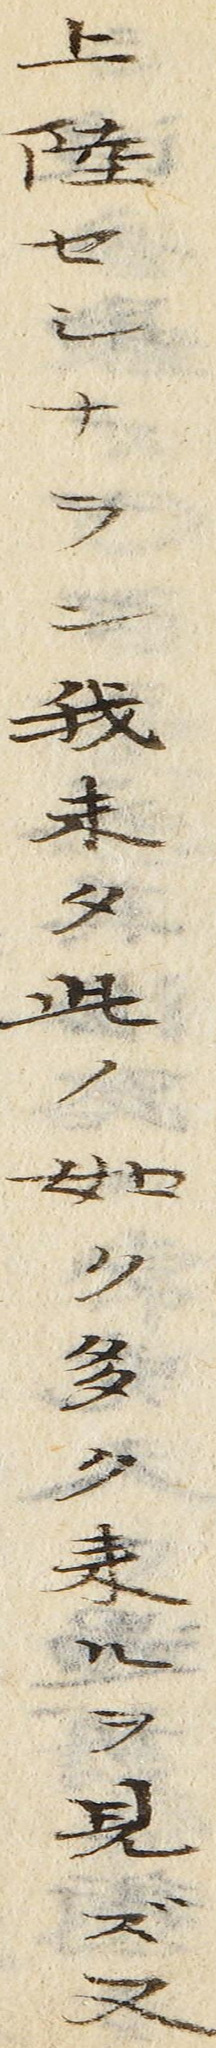上陸セシナラン我未タ此ノ如ク多ク来ルヲ見ズ又
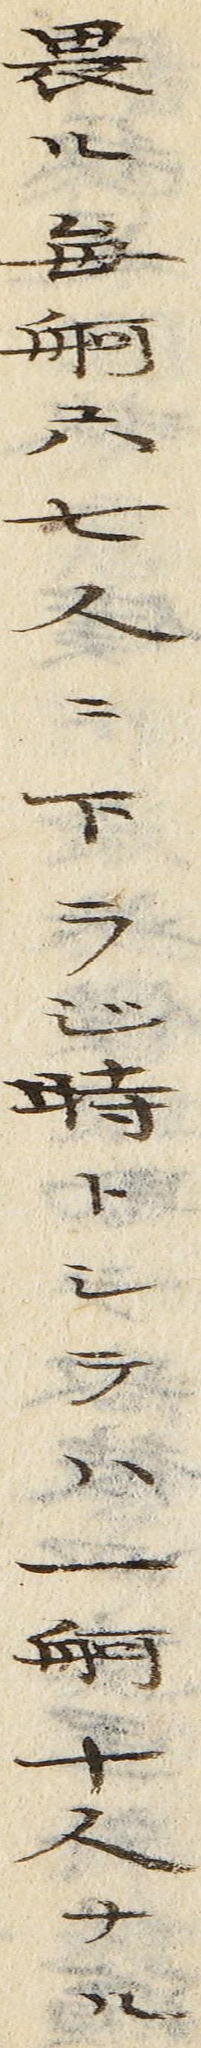畏ル毎舸六七人ニ下ラジ時トシテハ一舸十人ナル
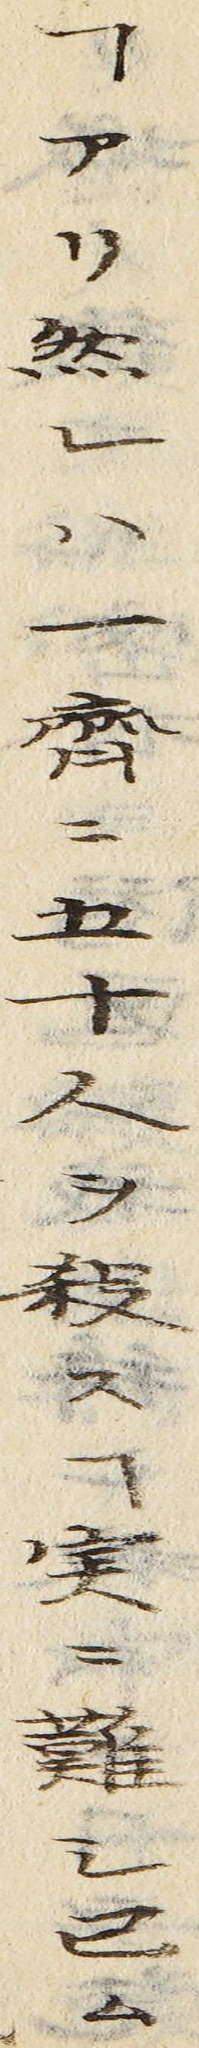コトアリ然レハ一斉ニ五十人ヲ殺スコト実ニ難シ已ム
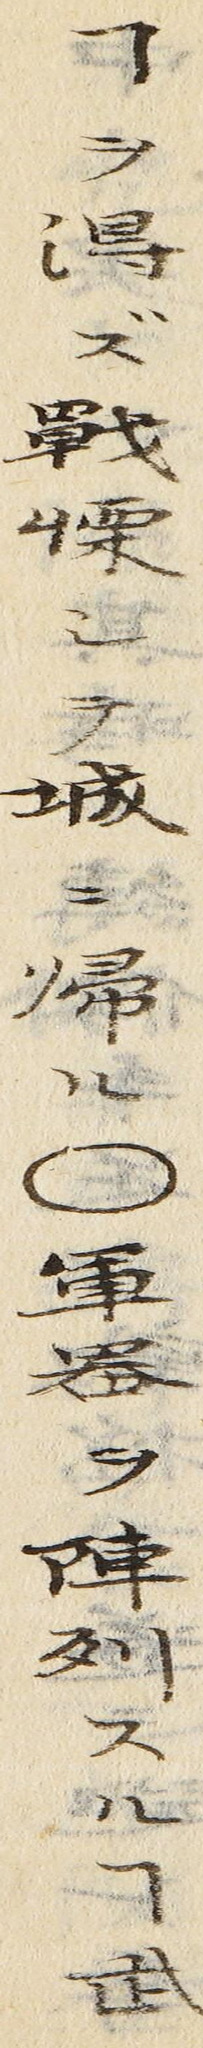コトヲ得ズ戦慄シテ城ニ帰ル◯軍器ヲ陣列スルコト武
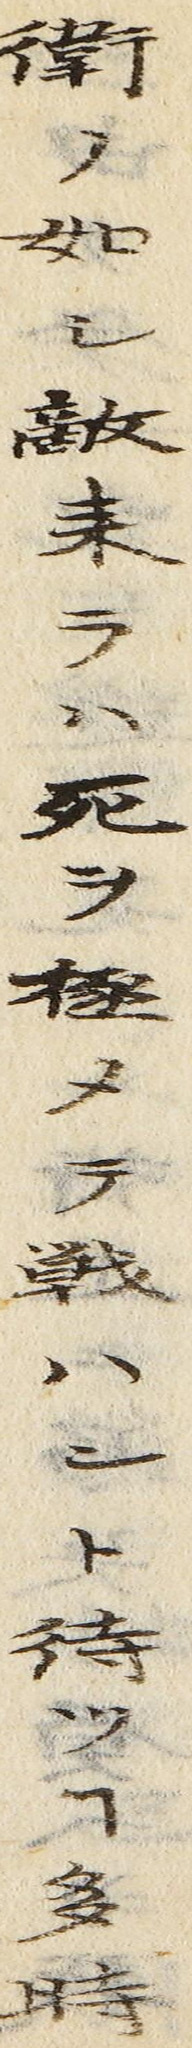衛ノ如シ敵来ラハ死ヲ極メテ戦ハント待ツコト多時
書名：漂流紀事
